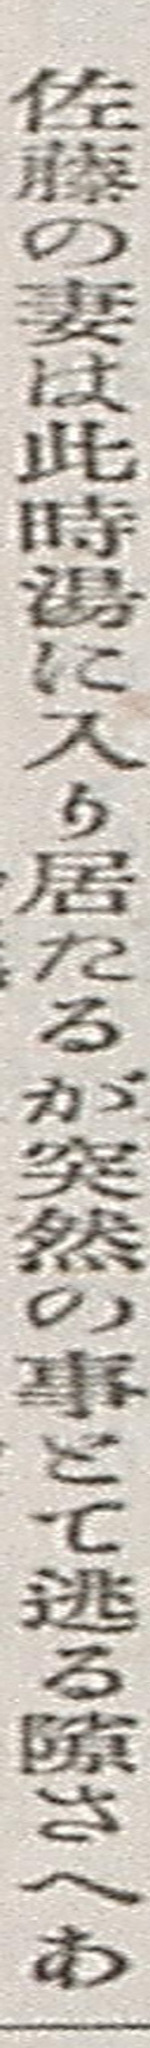佐藤の妻は此時湯に入り居たるが突然の事とて逃る隙さへあ
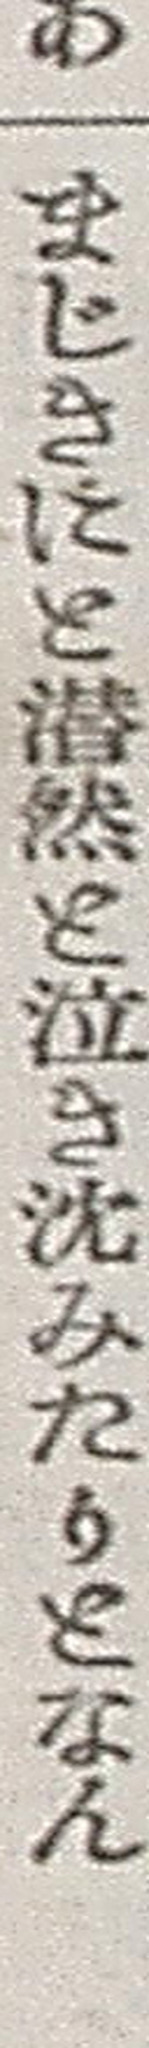まじきにと潜然と泣き沈みたりとなん
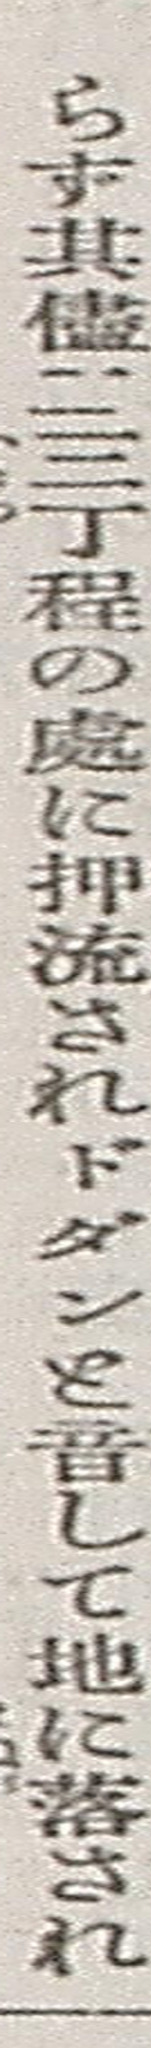らず其侭二三丁程の処に押流されドダンと音して地に落され
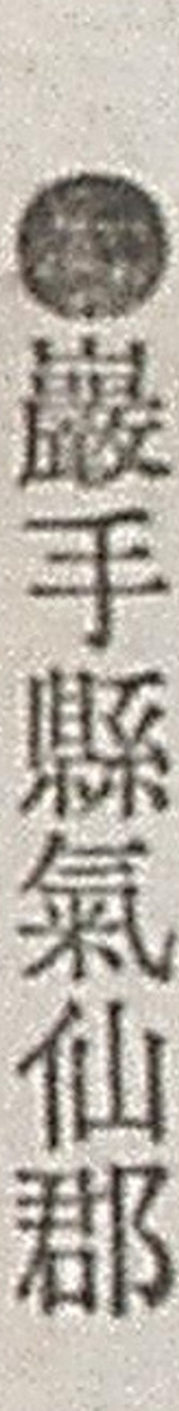●岩手県気仙郡
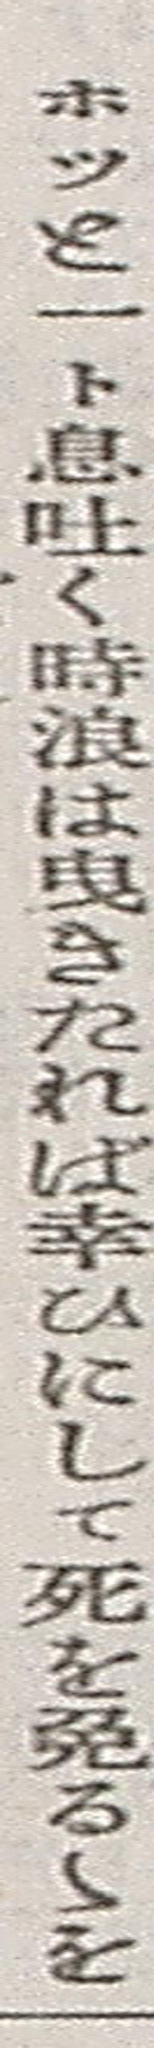ホツと一ト息吐く時浪は曳きたれば幸ひにして死を免るゝを
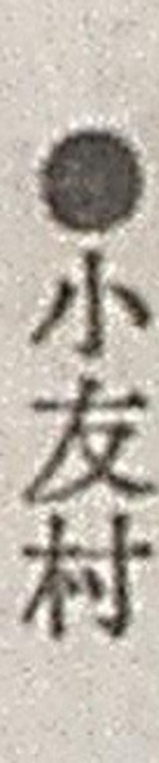●小友村
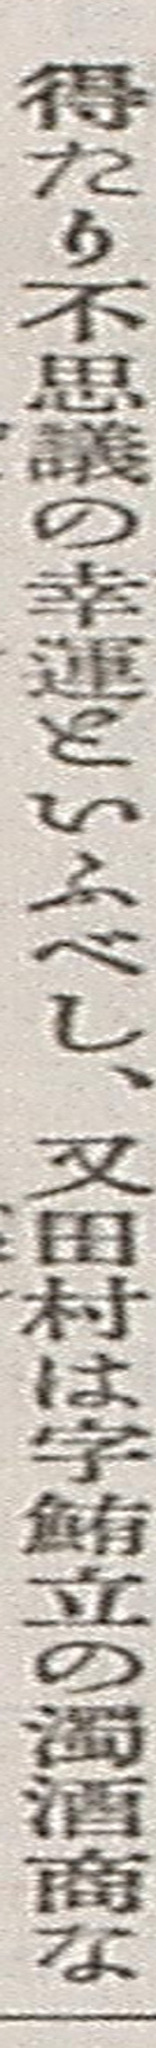得たり不思議の幸運といふべし、又田村は字鮪立の濁酒商な
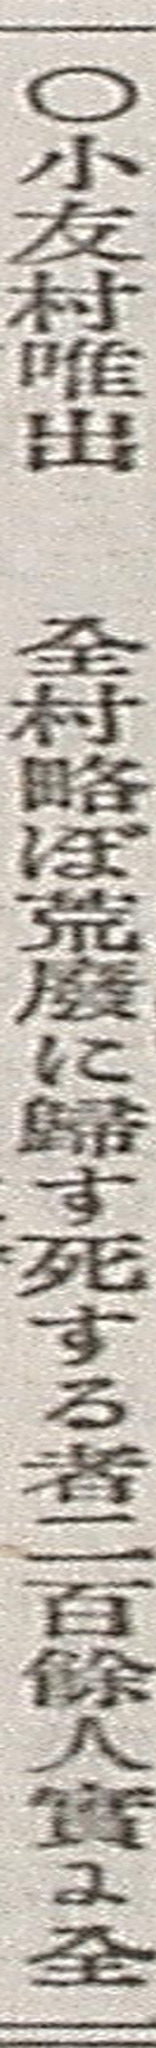○小友村唯出全村略ぼ荒廃に帰す死する者ニ百余人実に全
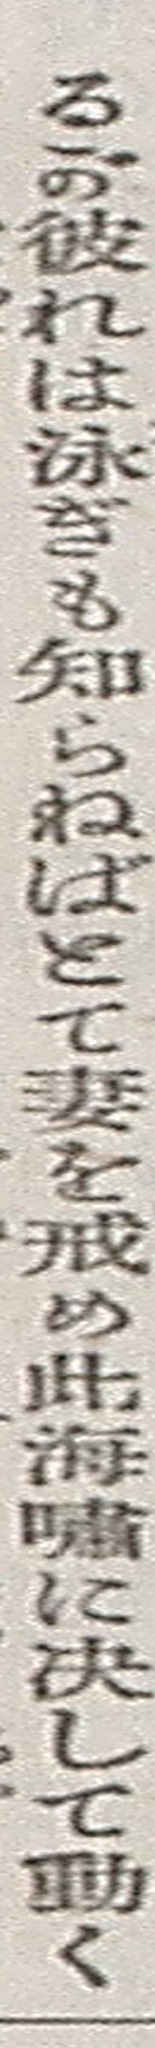るが彼れは泳ぎも知らねばとて妻を戒め此海嘯に決して動く
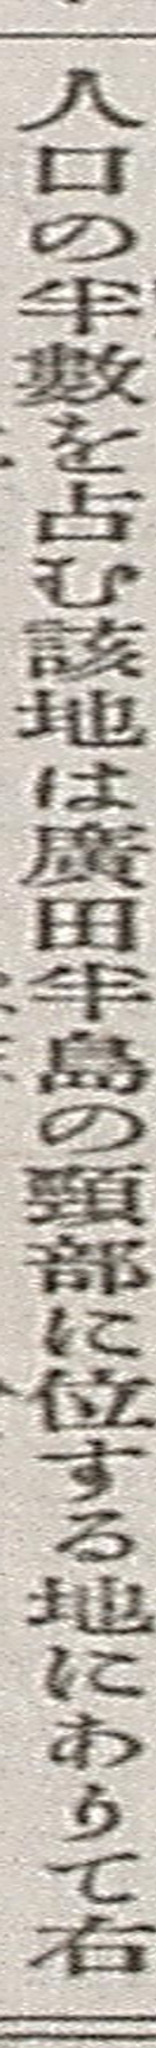人口の半数を占む該地は広田半島の頸部に位する地にありて右
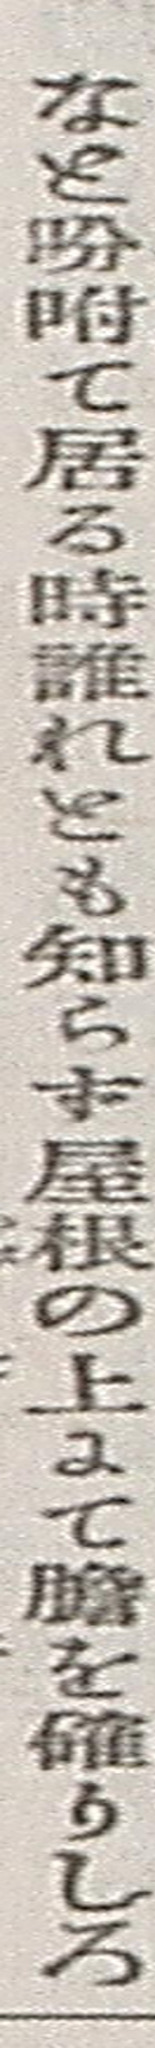なと吩付て居る時誰れとも知らず屋根の上にて胆を確りしろ
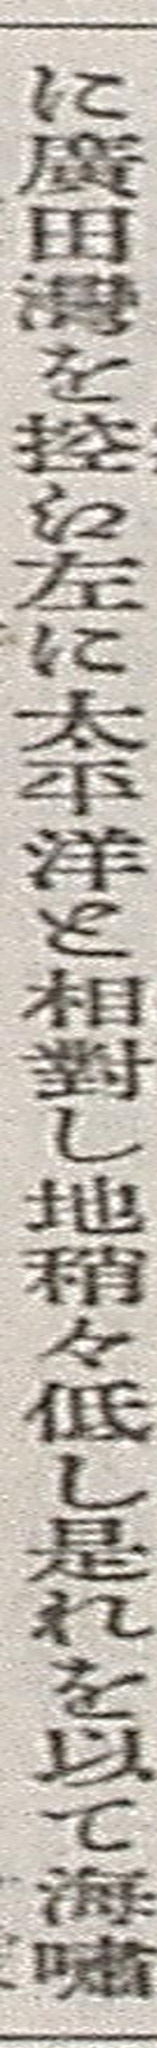に広田湾を控え左に太平洋と相対し地稍々低し是れを以て海嘯
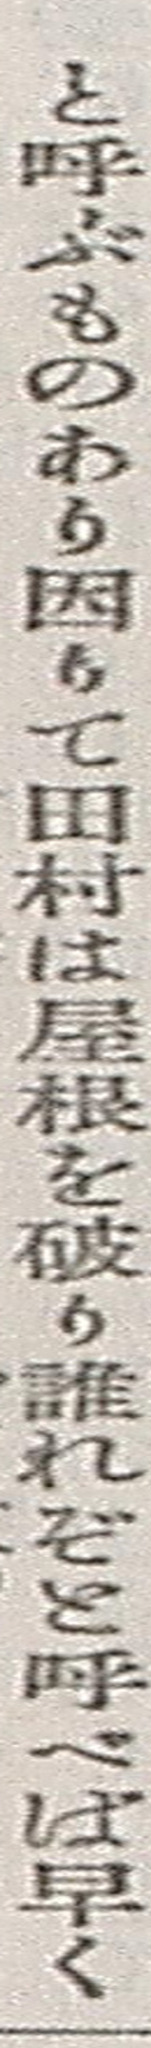と呼ぶものあり因りて田村は屋根を破り誰れぞと呼べば早く
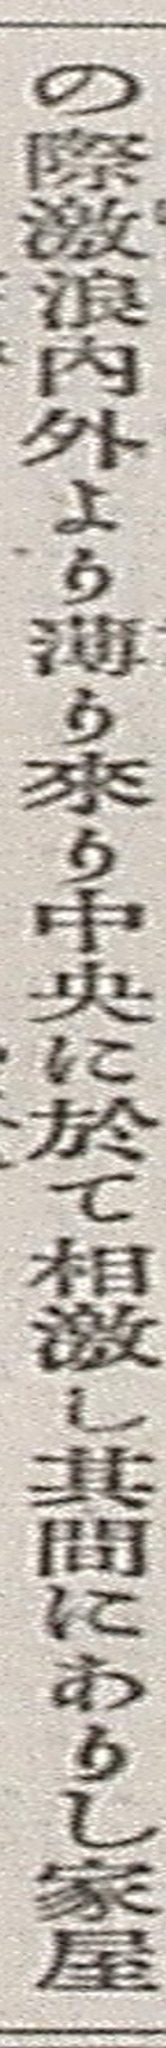の際激浪内外より薄り来り中央に於て相激し其間にありし家屋
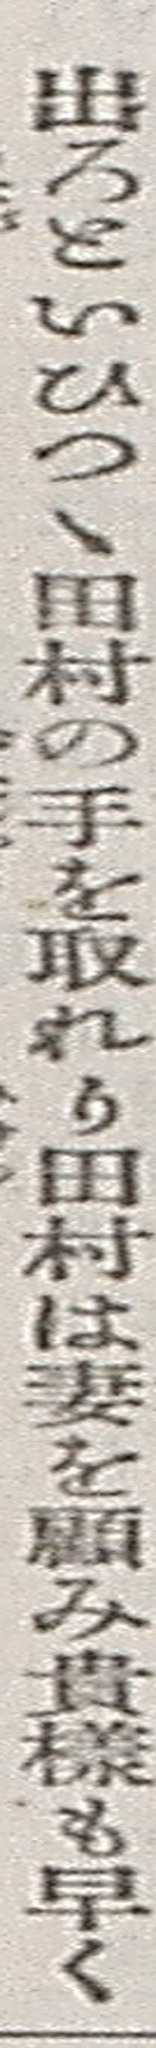出ろといひつゝ田村の手を取れり田村は妻を顧み貴様も早く
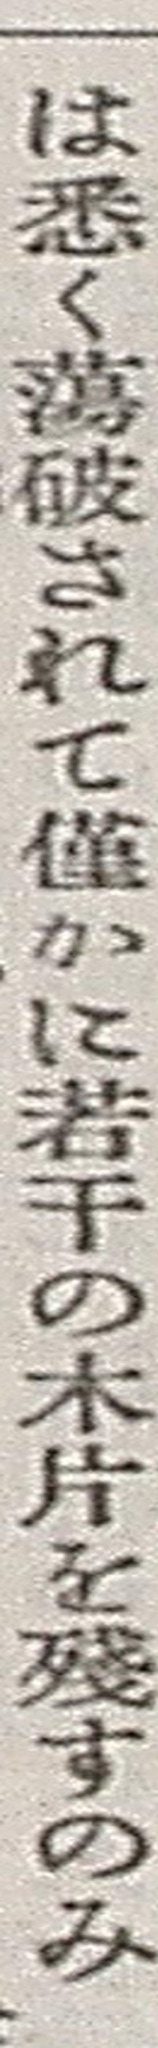は悉く蕩破されて僅かに若干の木片を残すのみ
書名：風俗畫報臨時増刊第百十九號　大海嘯被害録（中）
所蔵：東京大学地震研究所図書室 Earthquake Research Institute Library, The University of Tokyo, JAPAN
